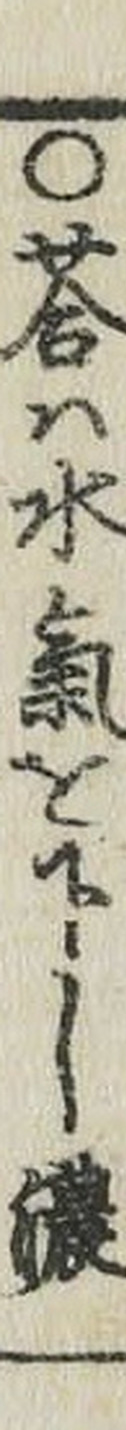○荅は水気を下し膿
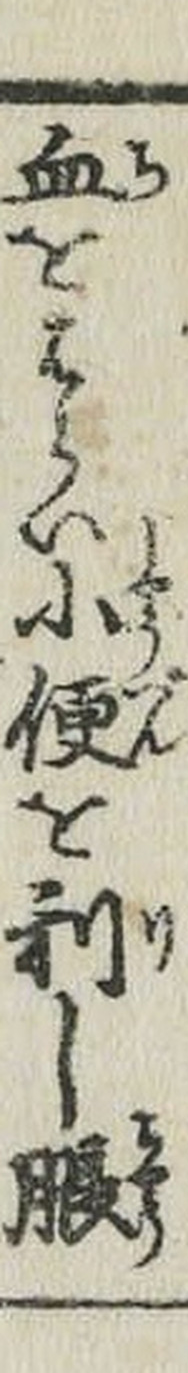血をはらい小便を利し脹
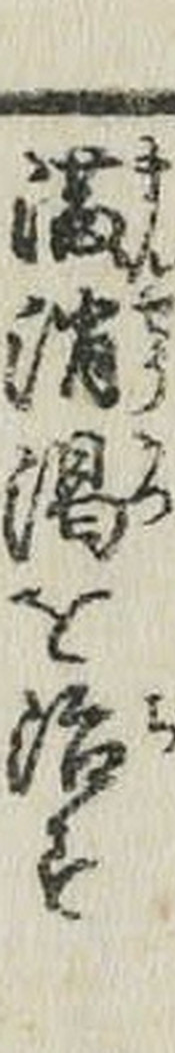満消渇を治す
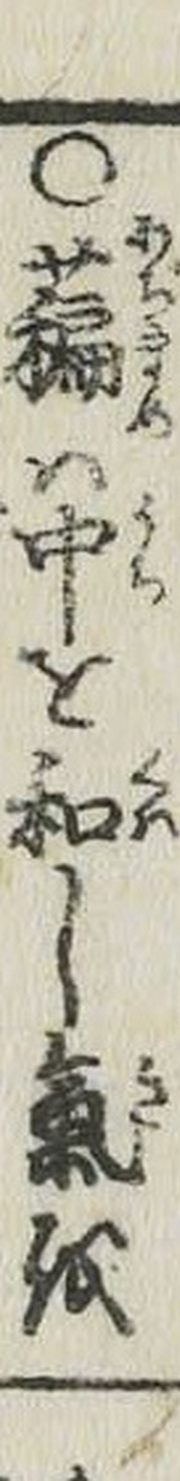○藊は中を和し気を
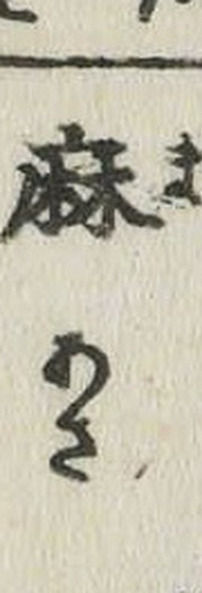麻あさ
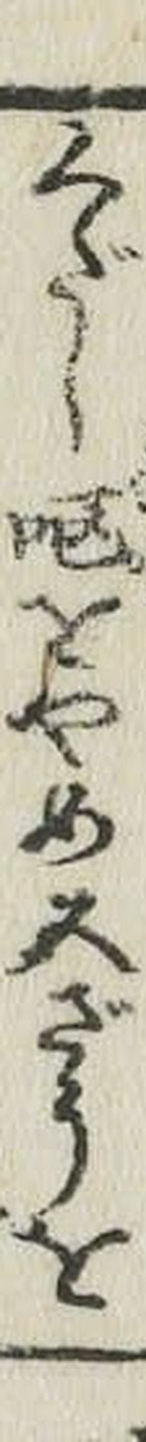くだし呕をやめ五ざうを
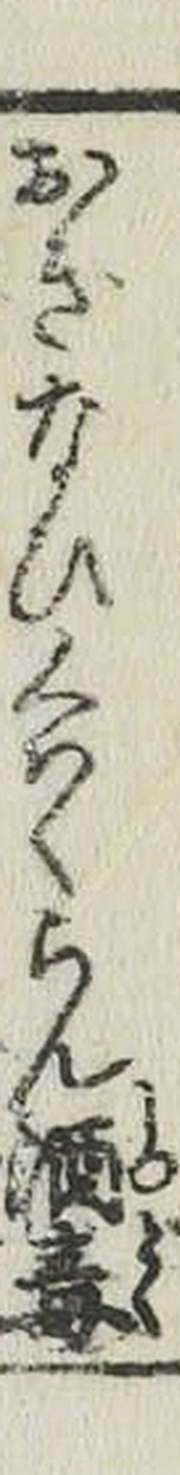おぎなひくわくらん酒毒
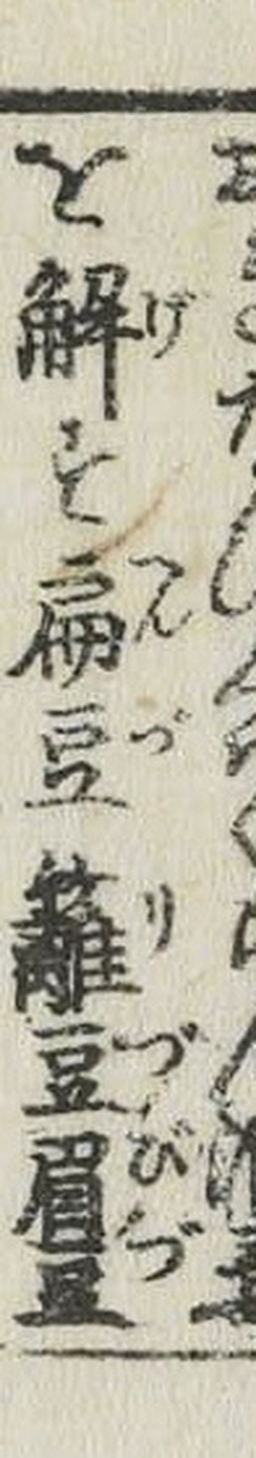を解す扁豆籬豆眉豆
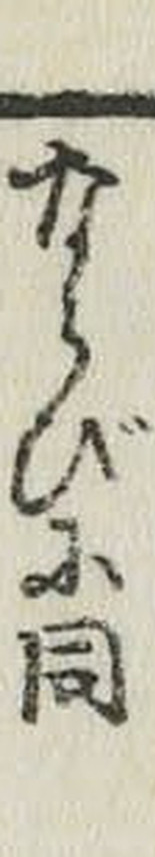ならびに同
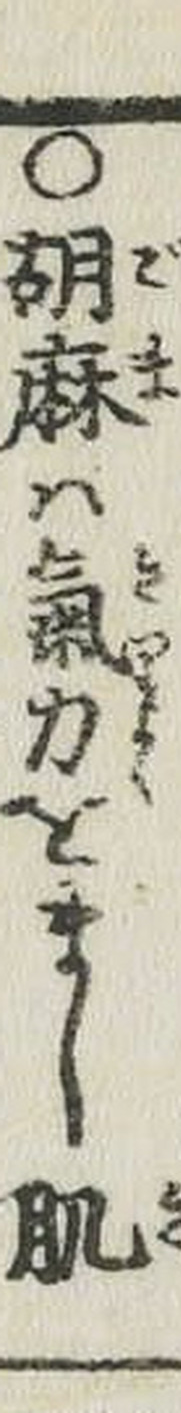○胡麻は気力をまし肌
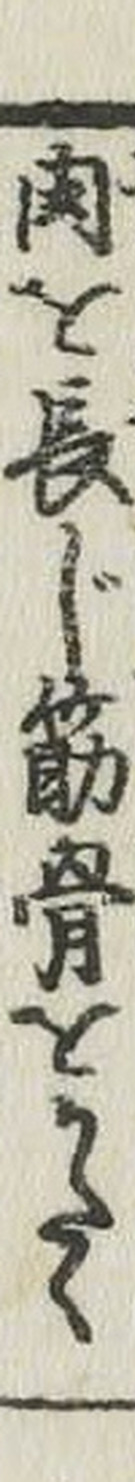肉を長じ筋骨をかたく
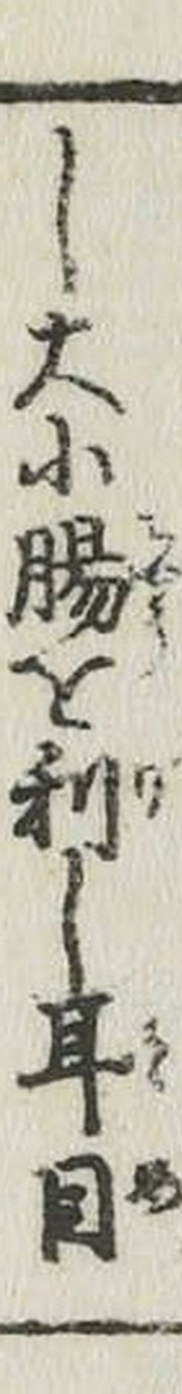し大小腸を利し耳目
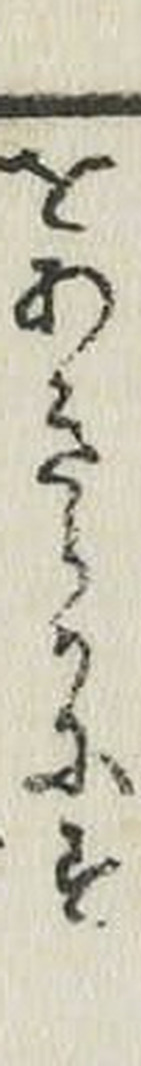をあきらかにす
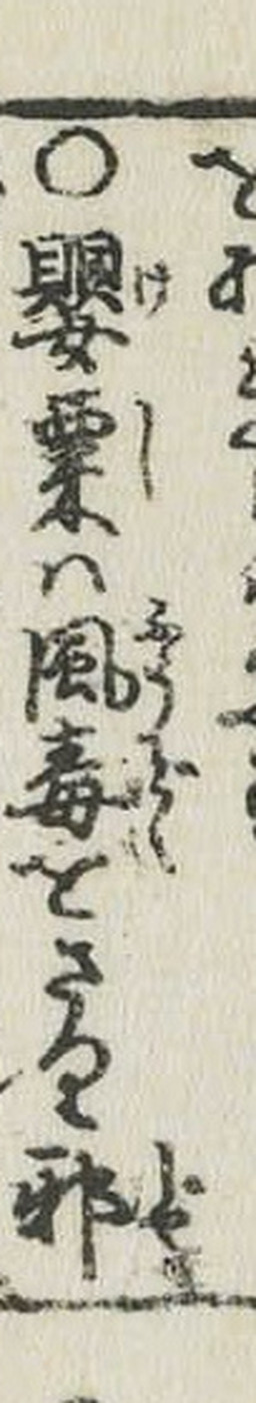○罌粟は風毒をさり邪
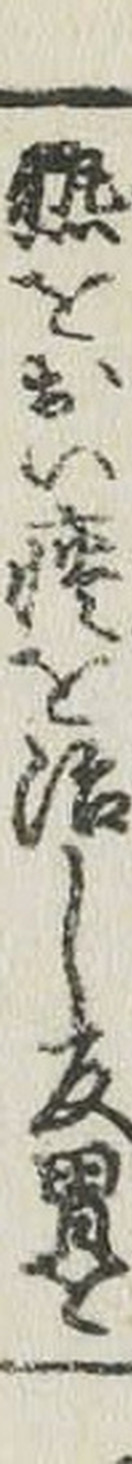熱をおい痰を治し反胃を
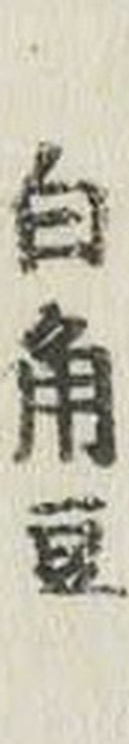白角豆
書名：増補頭書訓蒙図彙大成 10巻 7:巻之14-16
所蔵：東京学芸大学教育コンテンツアーカイブ
